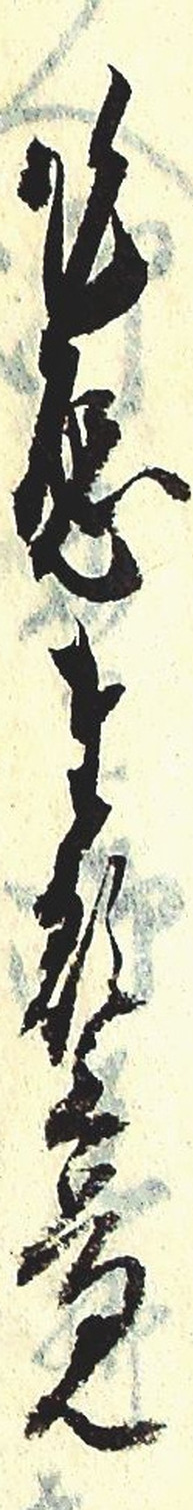乍恐奉願上覚
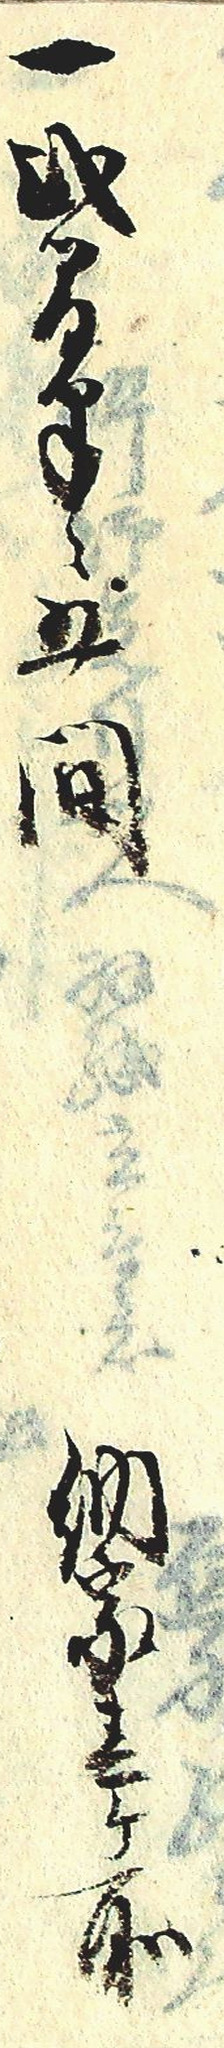一弍間半に五間納家壱ヶ所
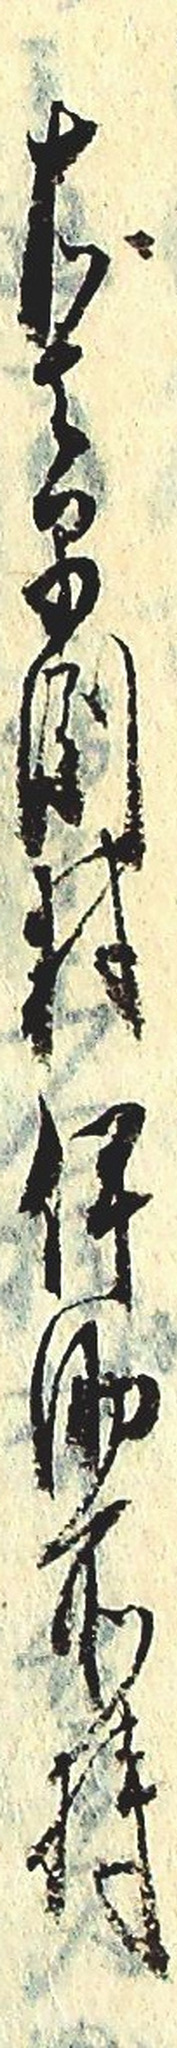右は早淵村伊助所持
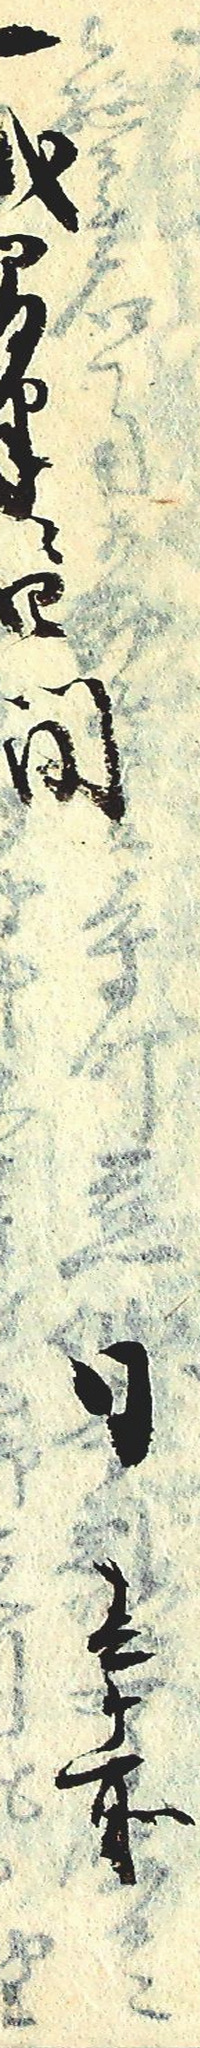一弍間半に四間同壱ヶ所
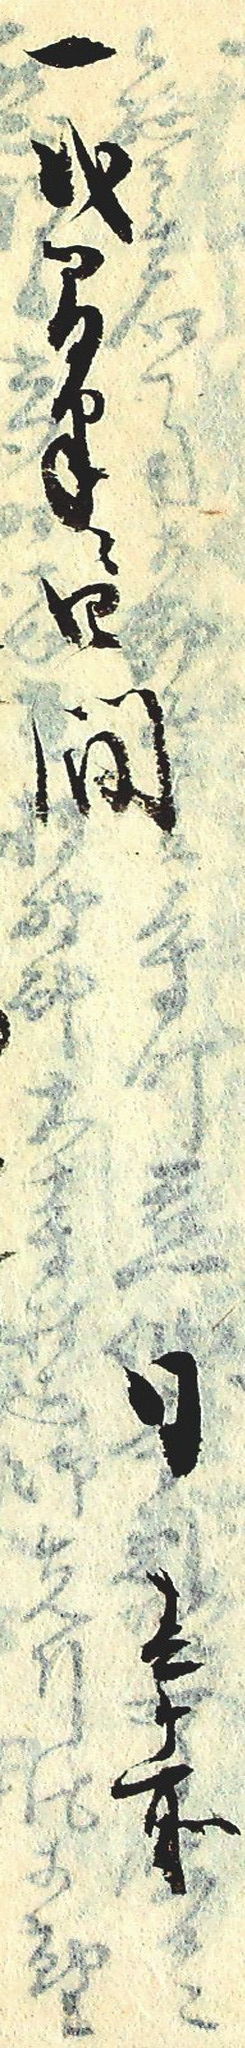一弍間半に四間同壱ヶ所
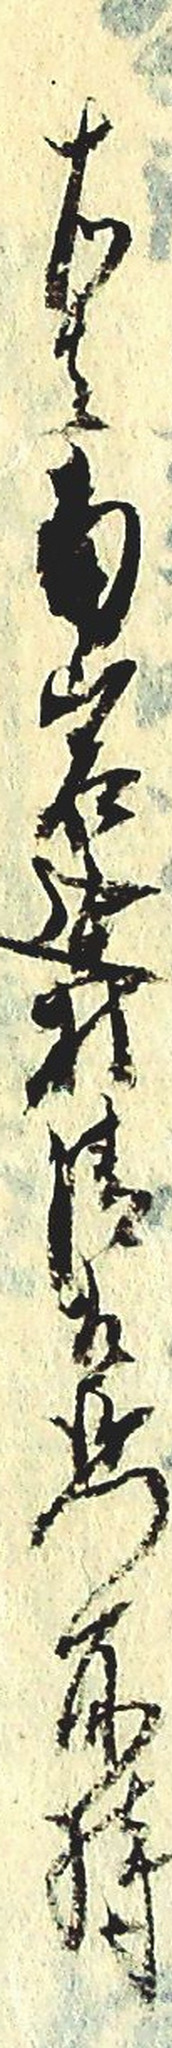右は南岩延村清左衛門所持
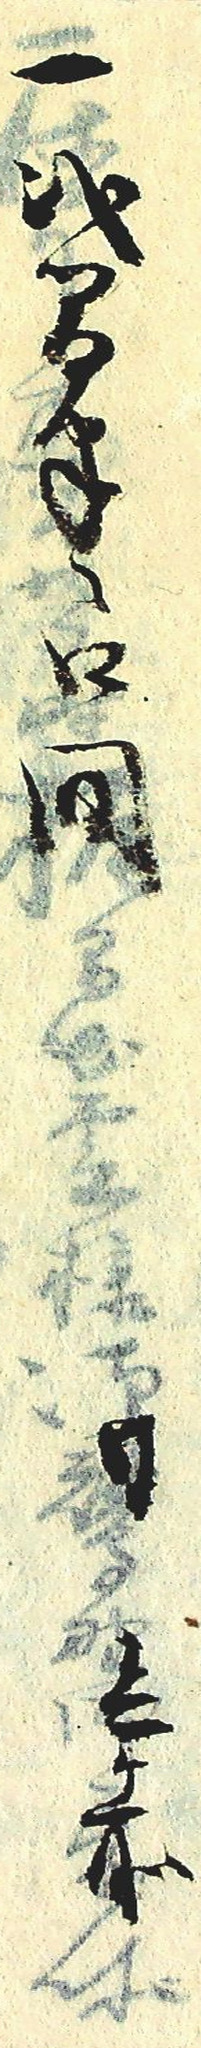一弍間半に四間同壱ヶ所
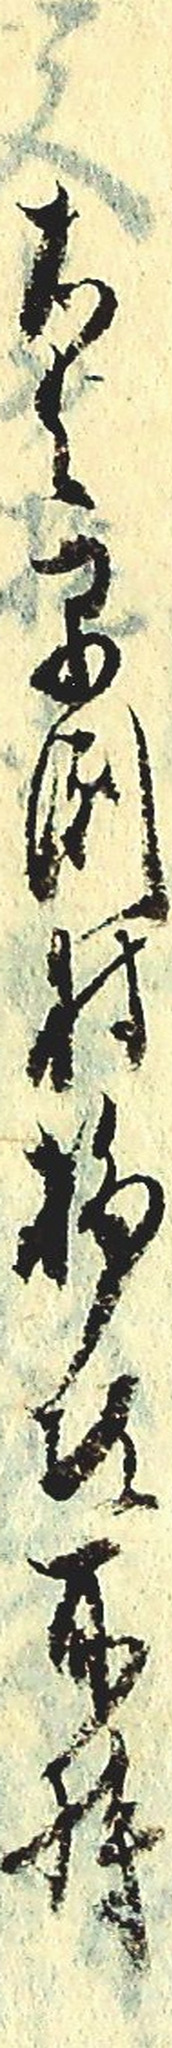右は早淵村柳次所持
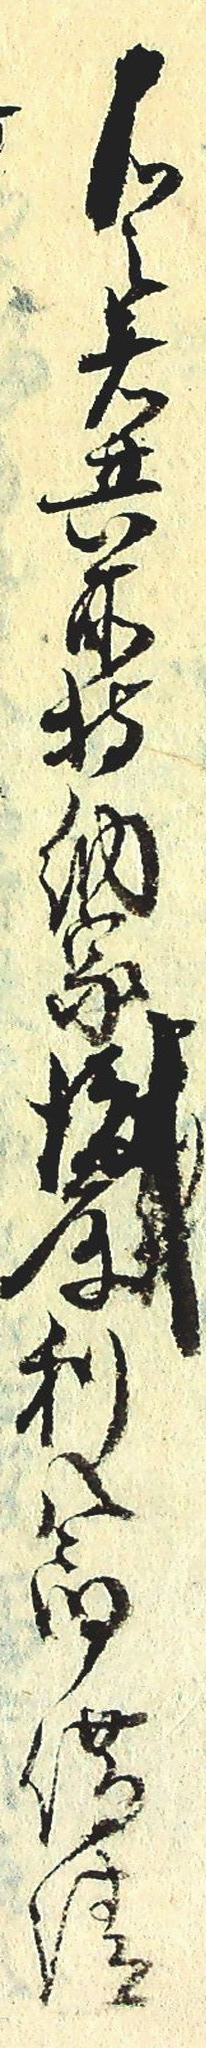右之者共所持納家後藤利八郎借請
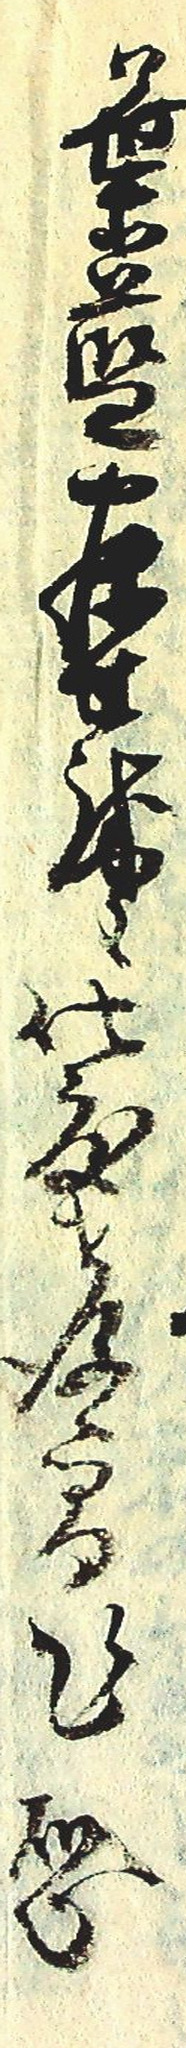葉藍寐せ床に仕度奉存候間乍恐
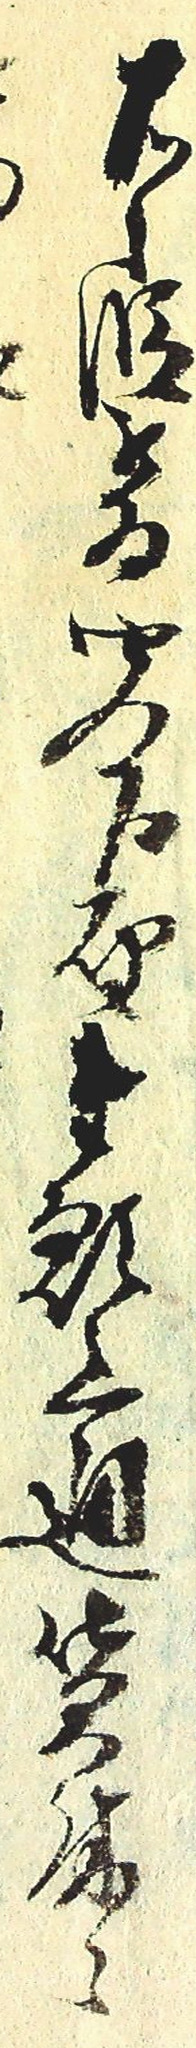右之段被為聞召届奉願上通貸床に
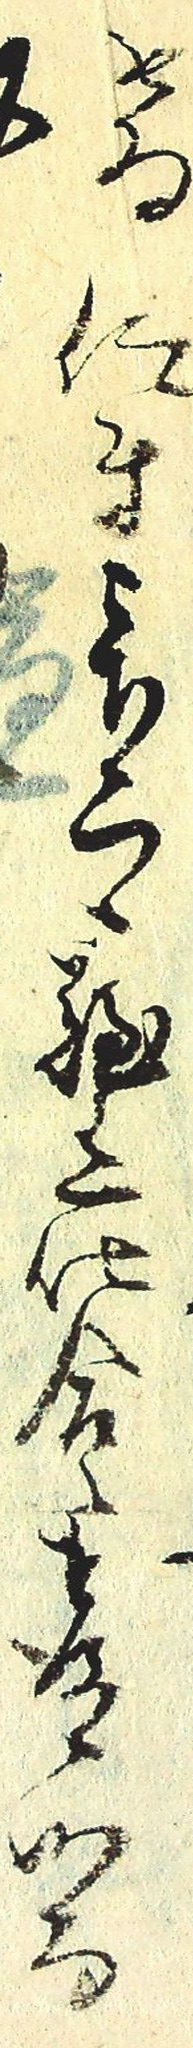被為仰付被下候はゝ難有仕合に奉存候仍て
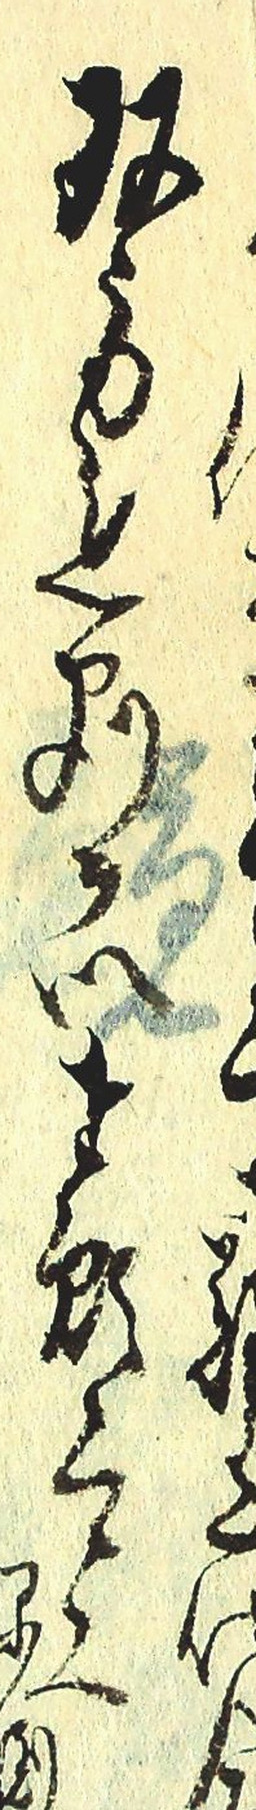双方連判を以奉願上候以上
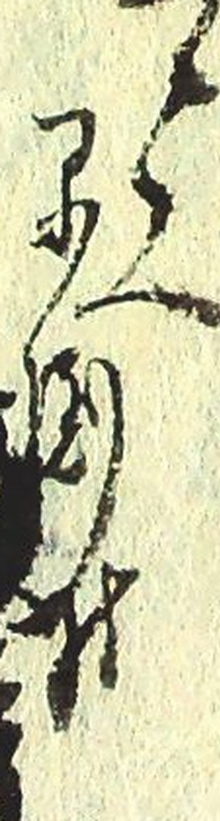早淵村
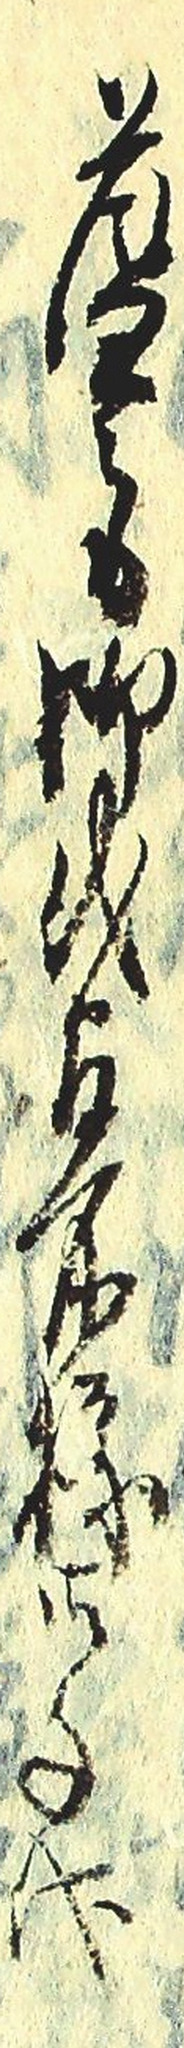藍方御代官所様御手代
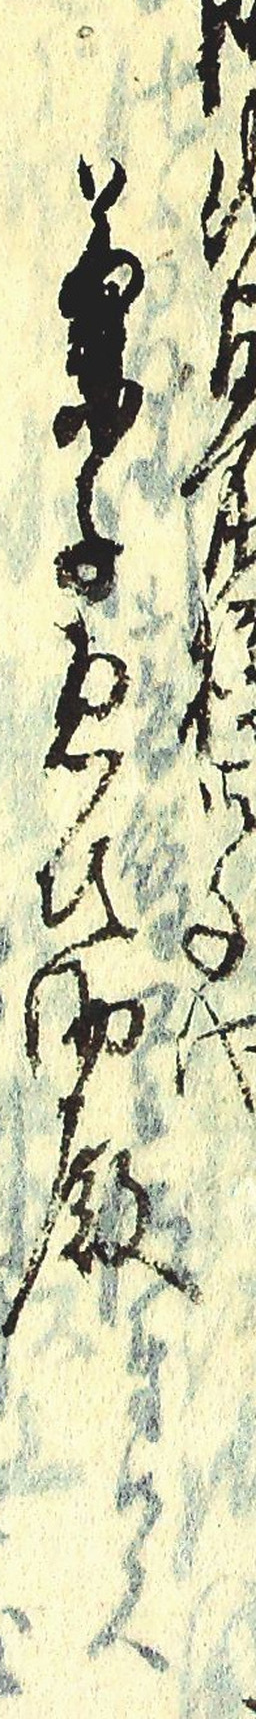兼子恵次助殿
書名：諸御願書控(弐番）
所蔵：鳴門教育大学 Naruto University of Education
